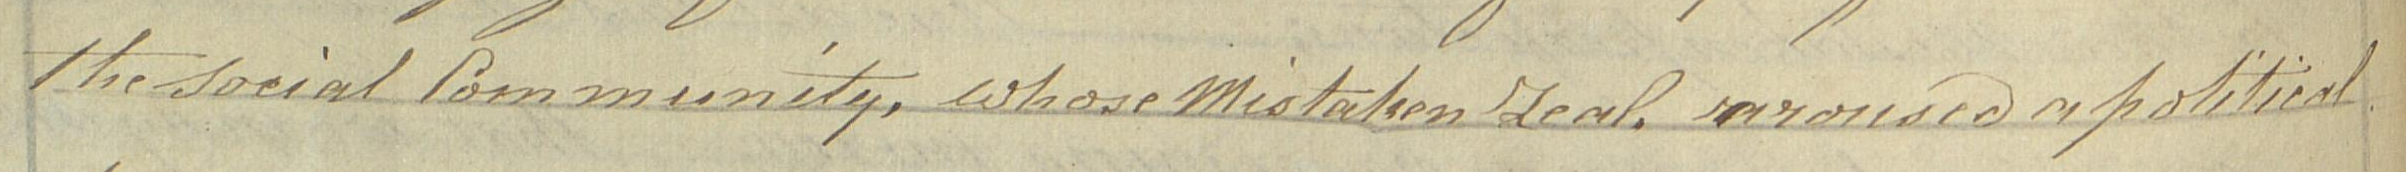The Social Community, whose Mistaken Zeal. aroused a political
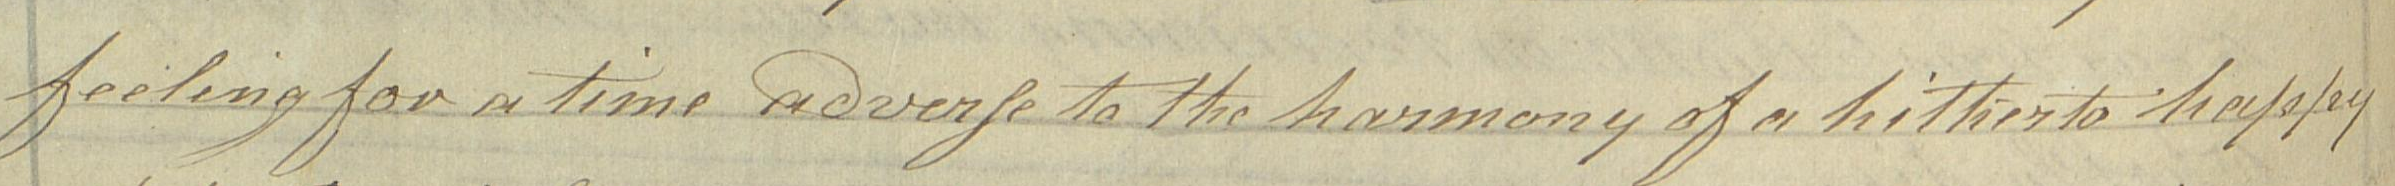feeling for a time adverse to the harmony of a hitherto happy
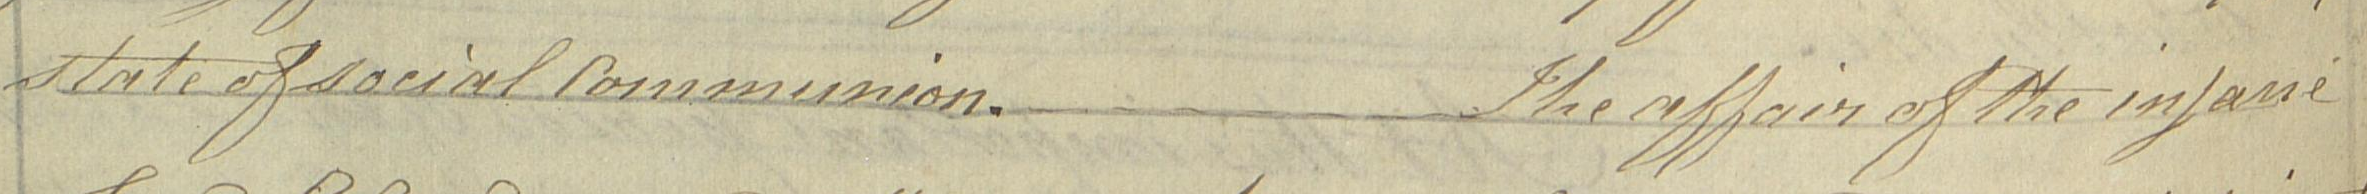state of social Communion. The affair of the insane
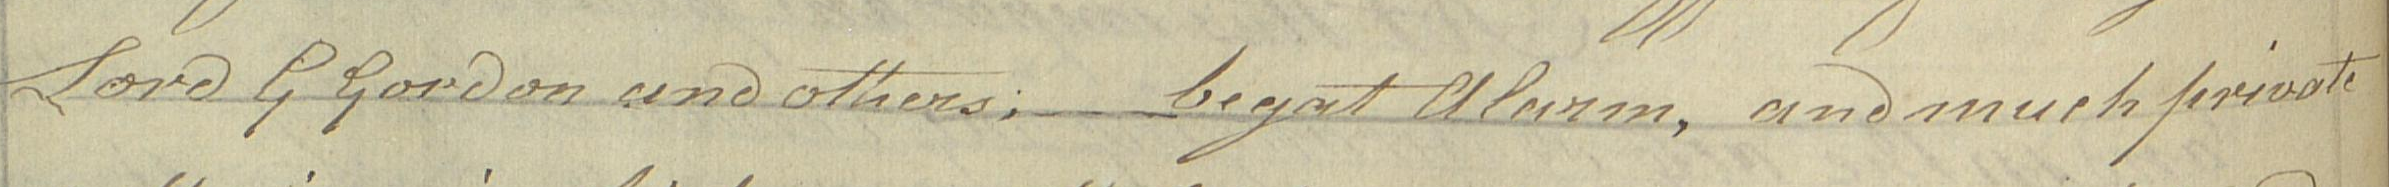Lord G. Gordon and others; begat Alarm, and much private
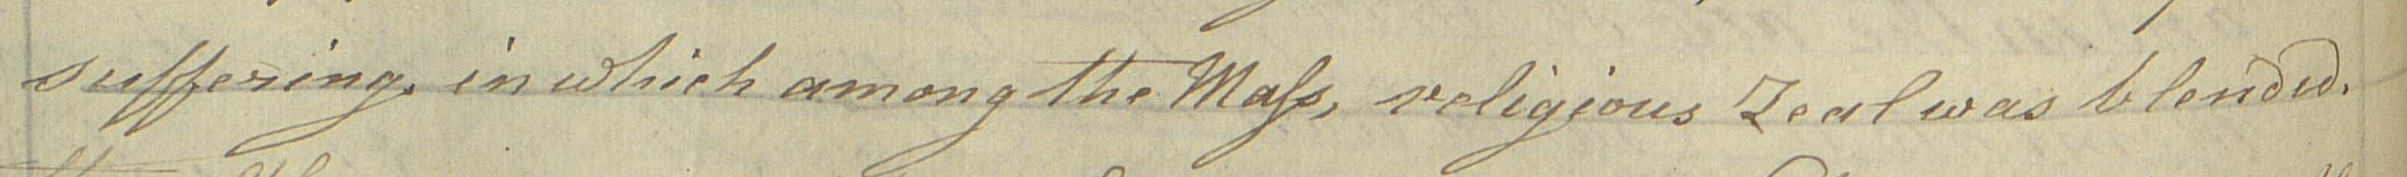suffering in which among the Mass religious Zeal was blended.
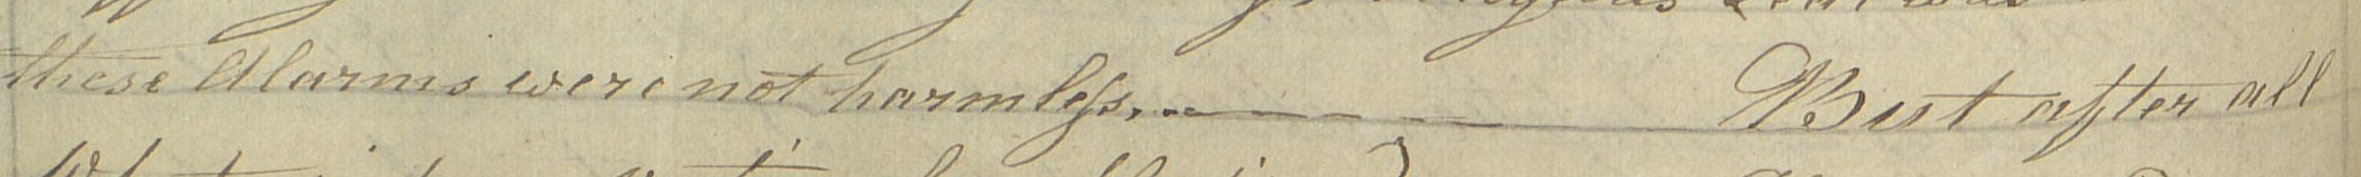these Alarms were not harmless. But after all
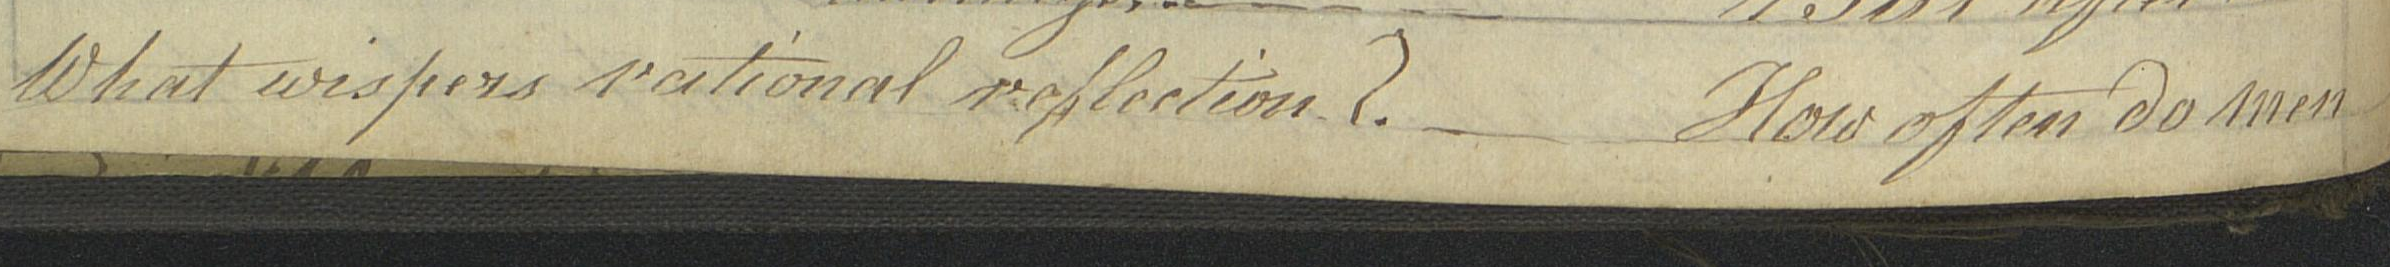What wispers rational reflection? How often do men
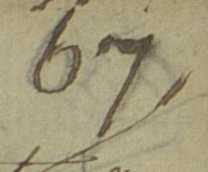67
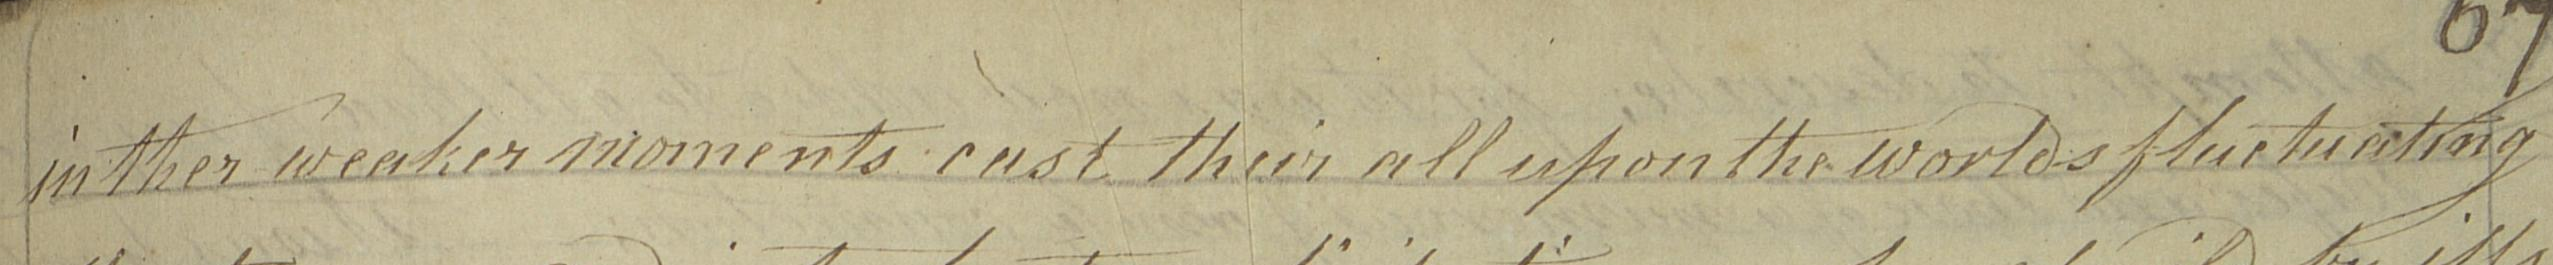in the weaker moments cast their all upon the worlds fluctuating
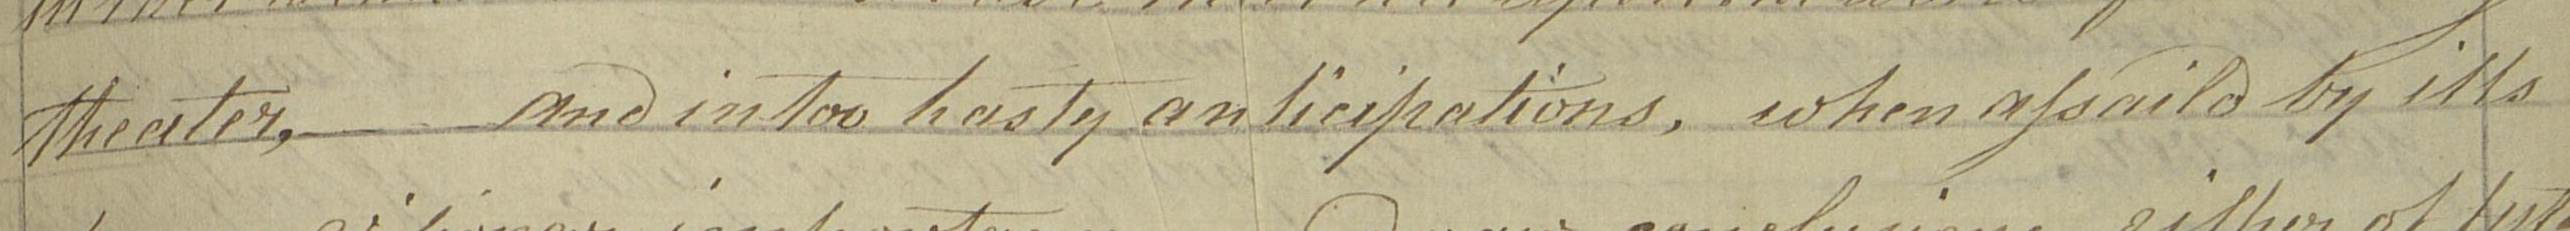theater, and in too hasty anticipations, when assail'd by ills
